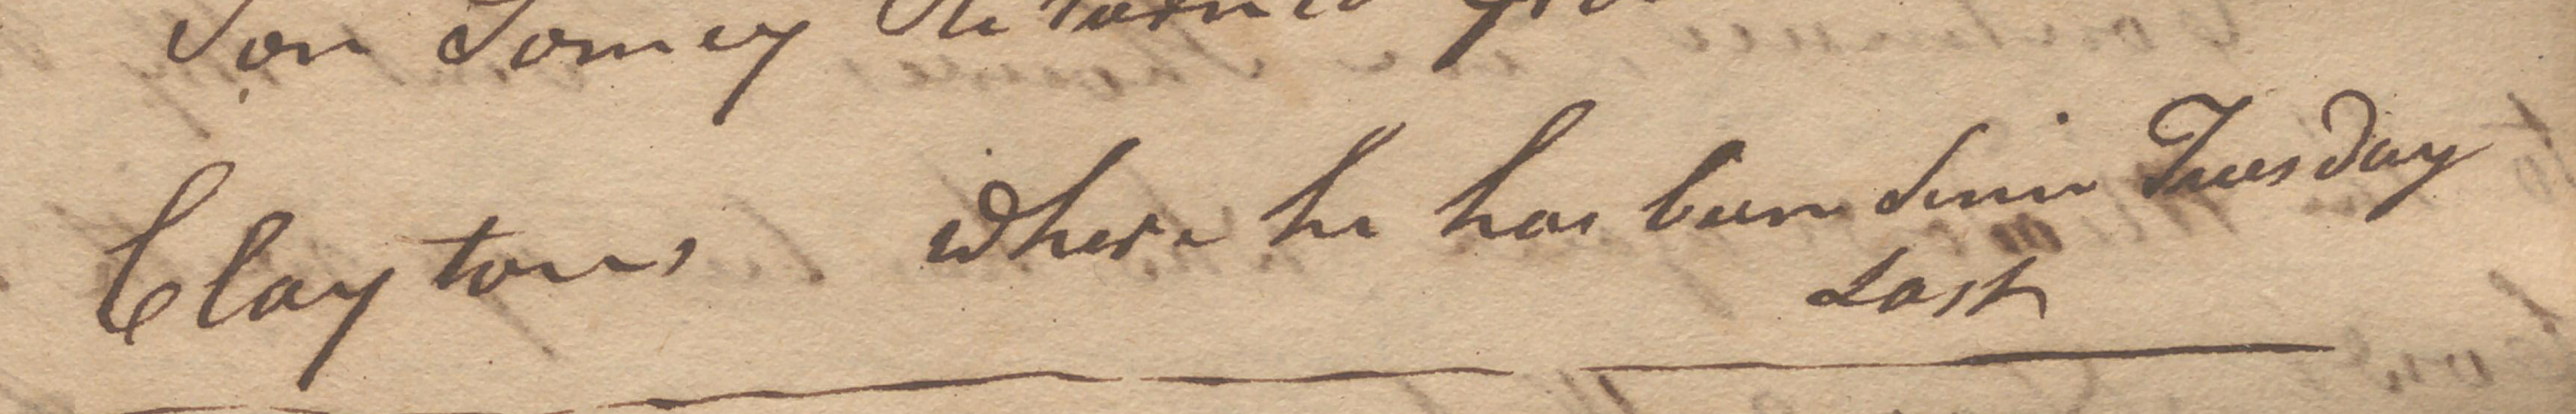Claytons where he has been since Tuesday
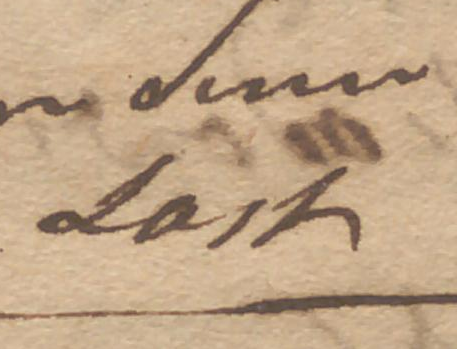Last
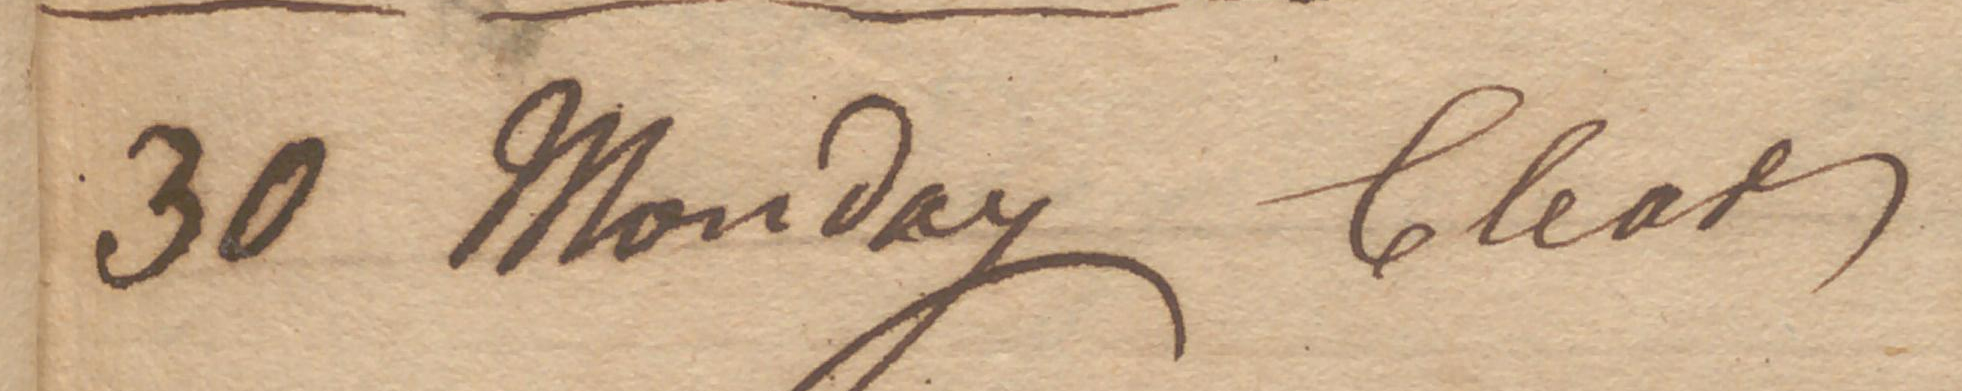30 Monday Clear
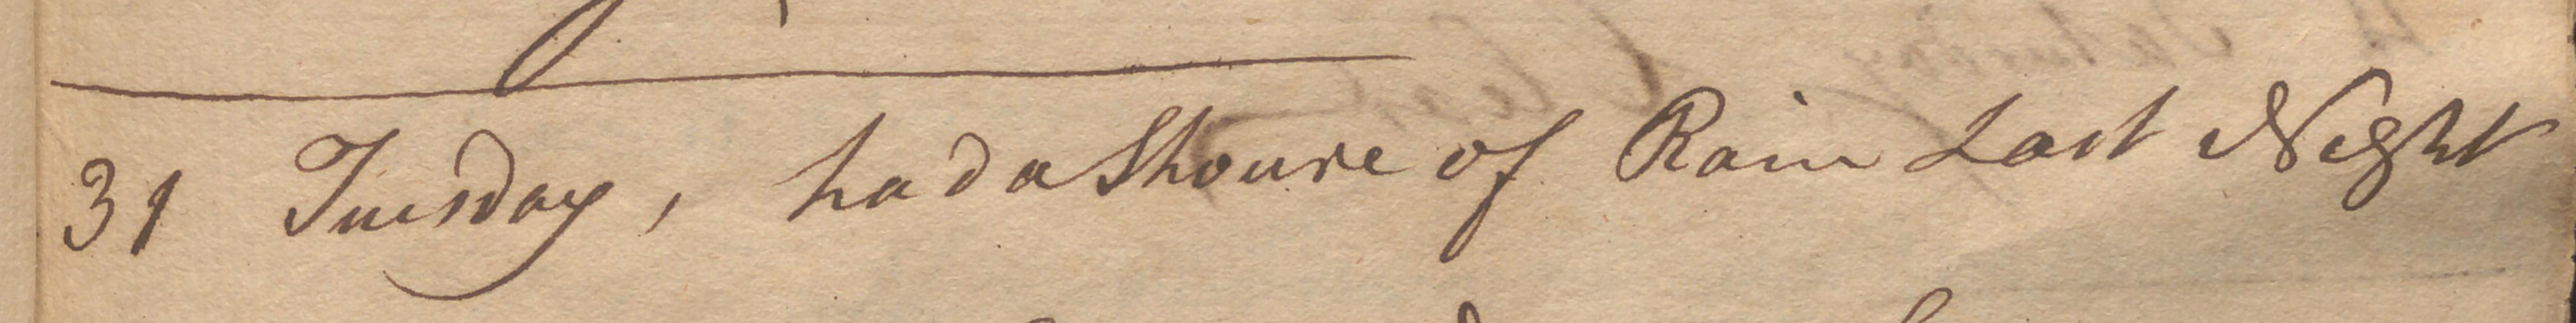31 Tuesday, had a Shoure of Rain Last Night
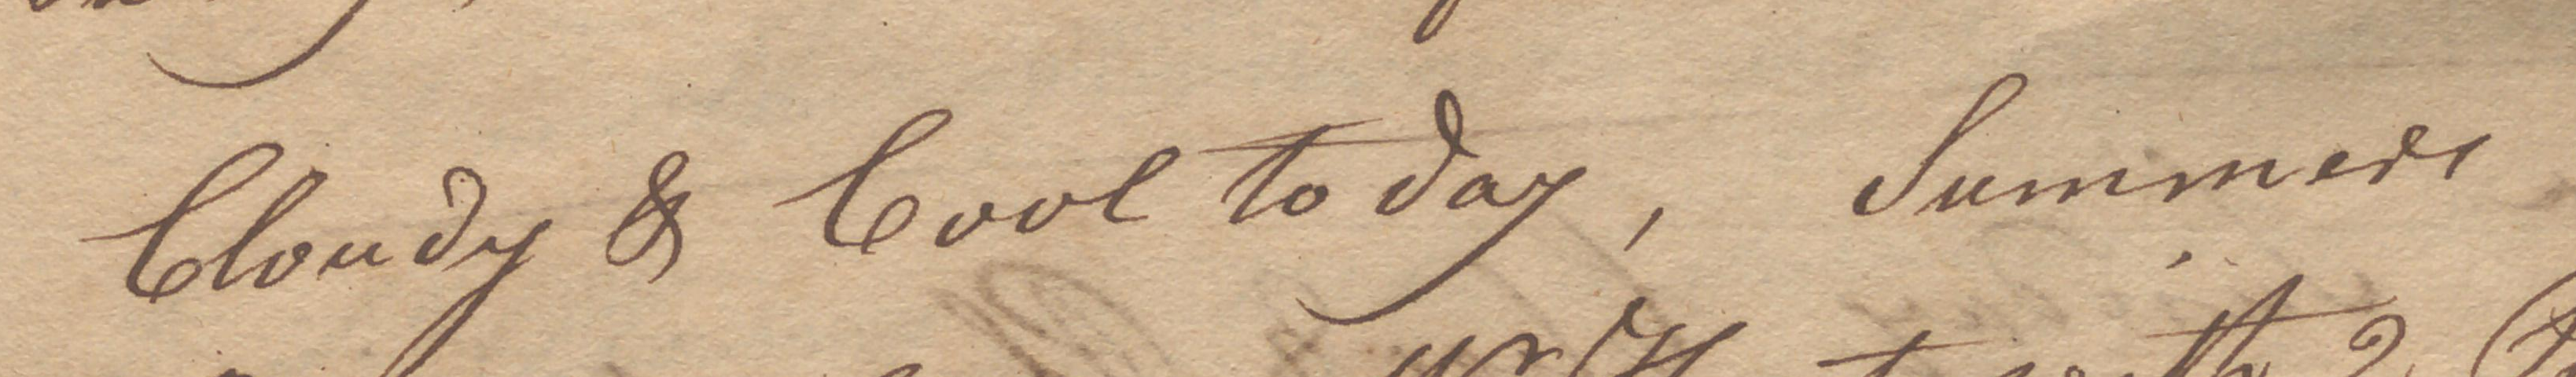Cloudy & Cool to day. Summers
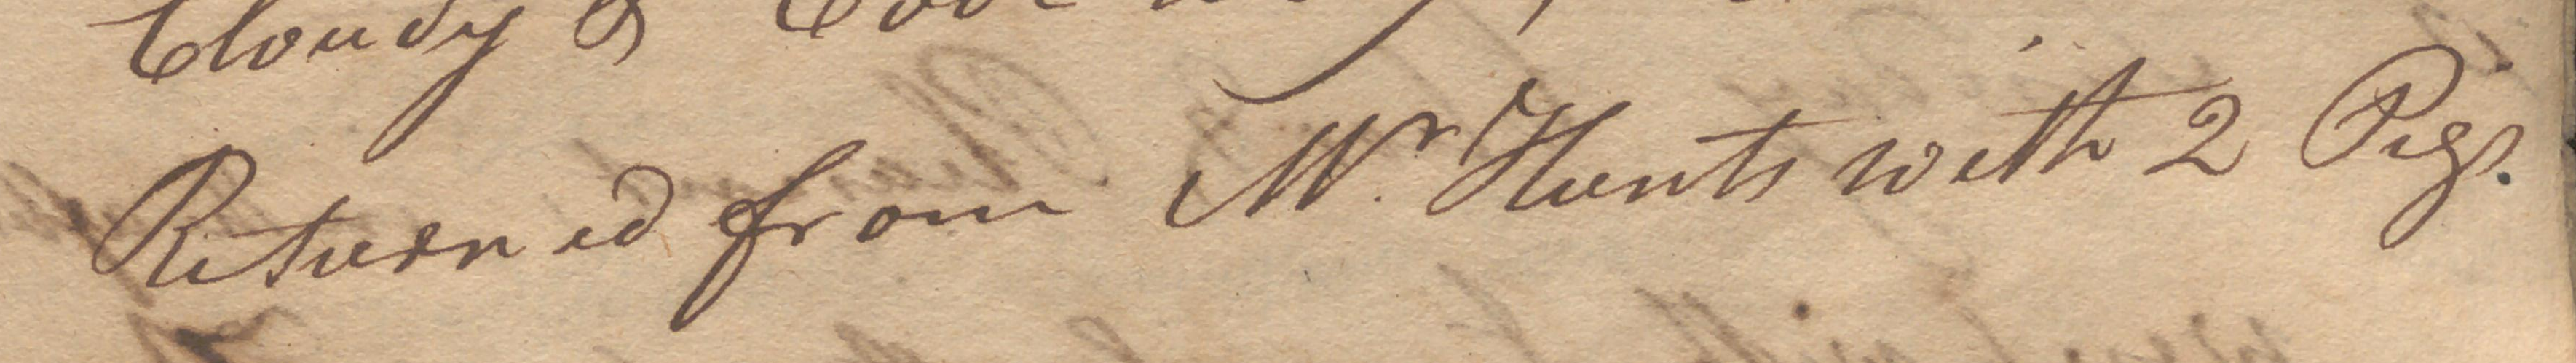Retusned from M^r. Hunts with 2 Pig^s.
